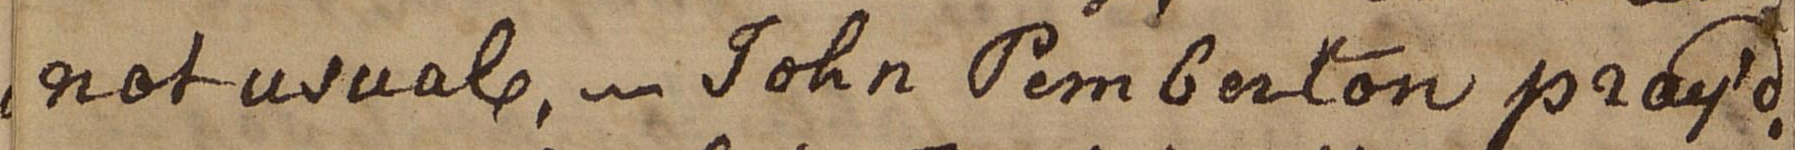not usual,- John Pemberton pray'd
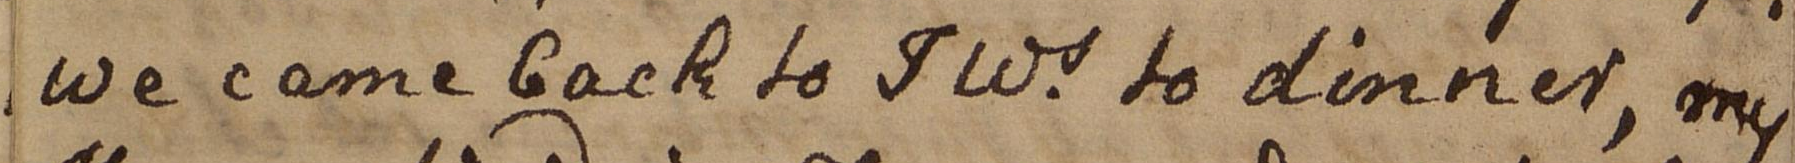we came back to TW^s. to dinner, my
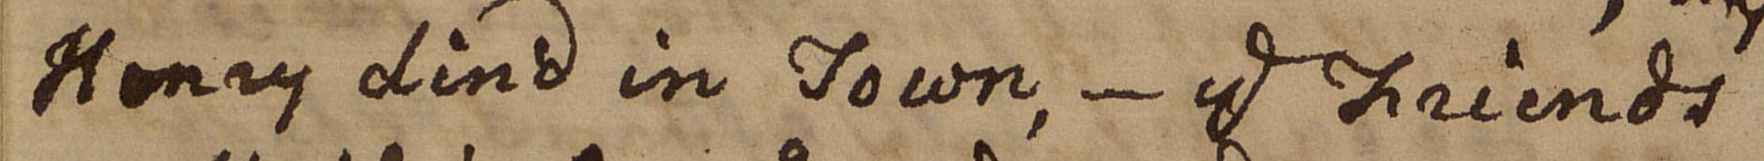Henry din'd in Town,- y^e Friends
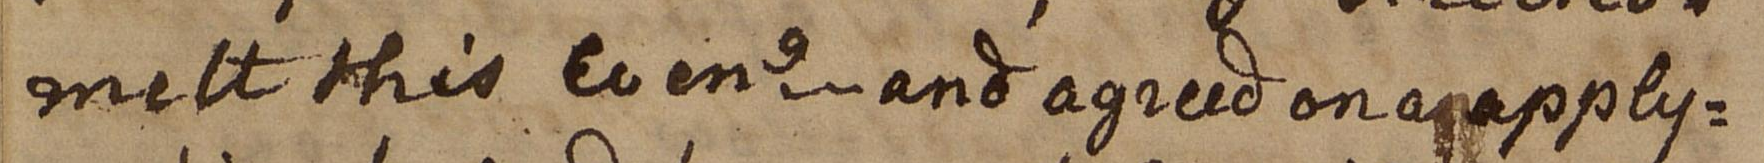mett this Even^g- and agreed on a apply-
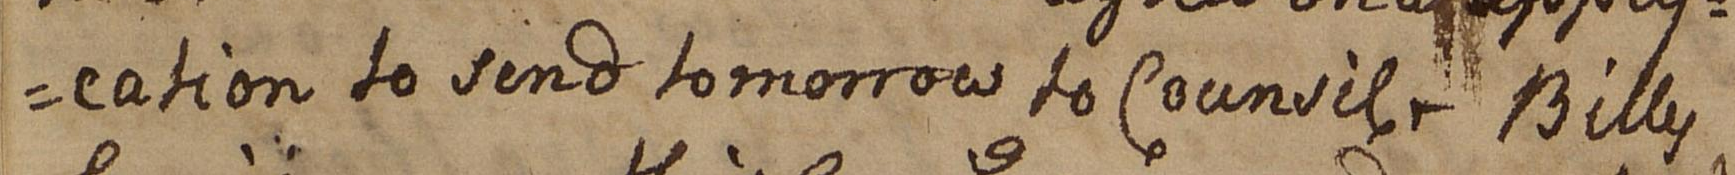-cation to send tomorrow to Counsil- Billy
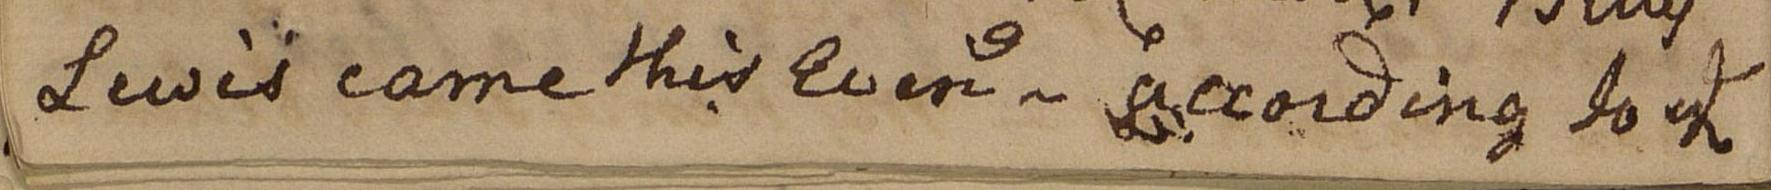Lewis came This Even^g- according to y^e
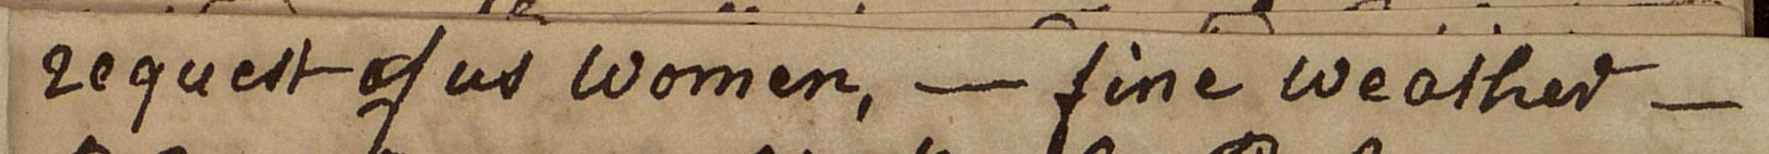request of us women,- fine weather-
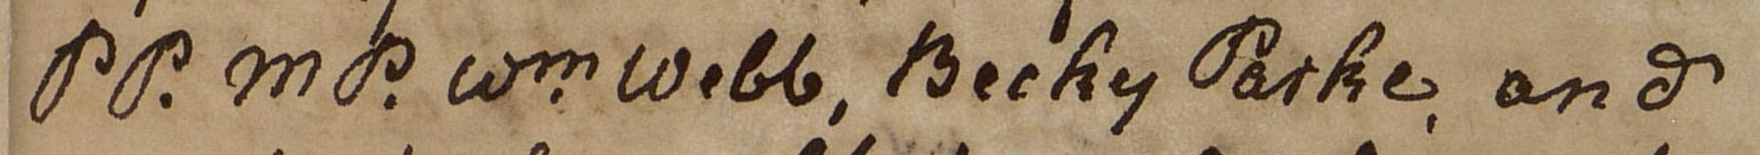PP. MP. W^m. Webb, Becky Parke, and
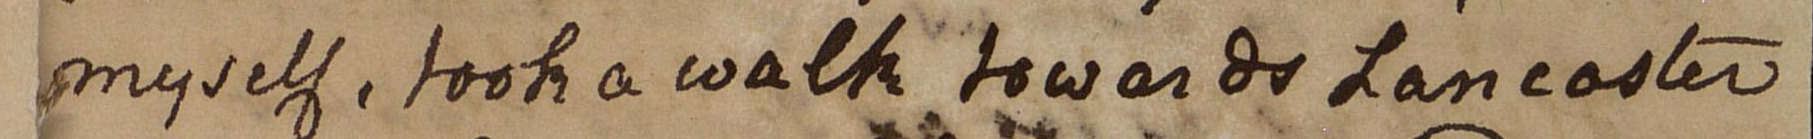myself, took a walk towards Lancaster
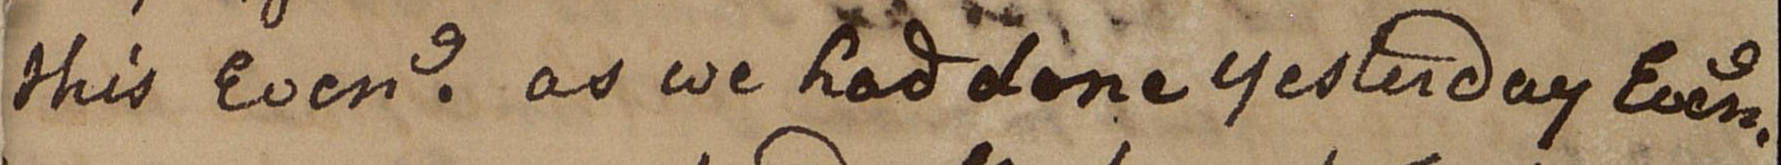this Even^g. as we had done Yesterday Even^g.
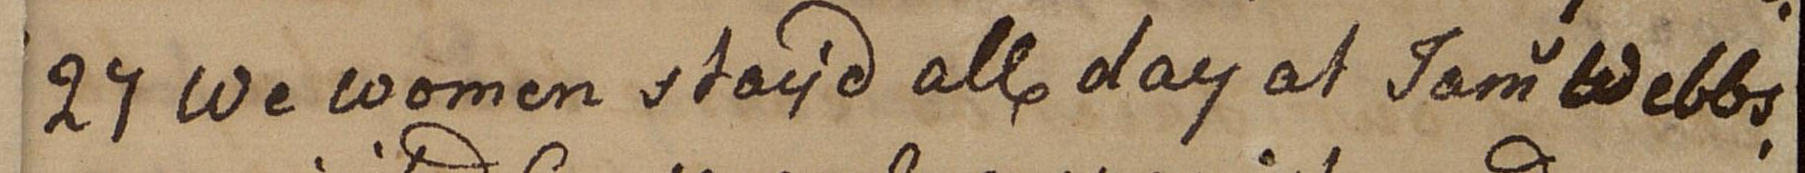27 we women stay'd all day at Sam^l Webbs,
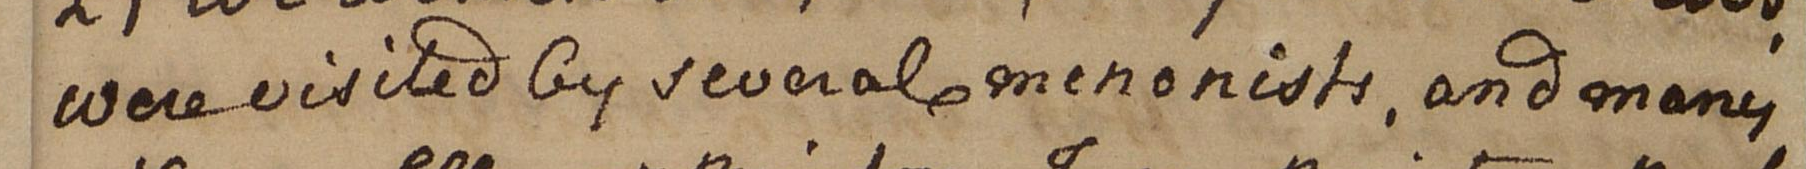were visited by several menonists, and many
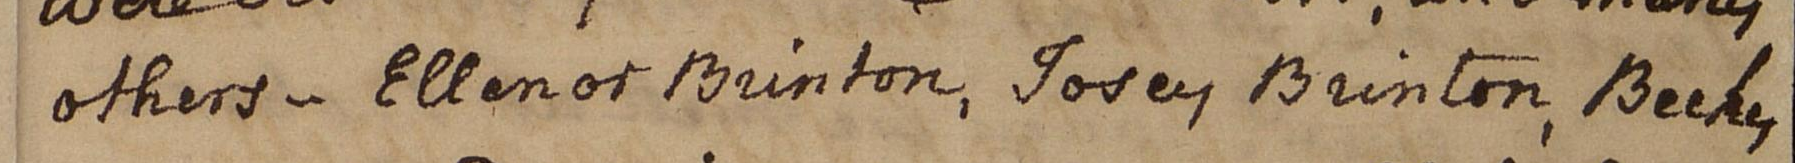others- Ellanor Brinton, Josey Brinton, Becky
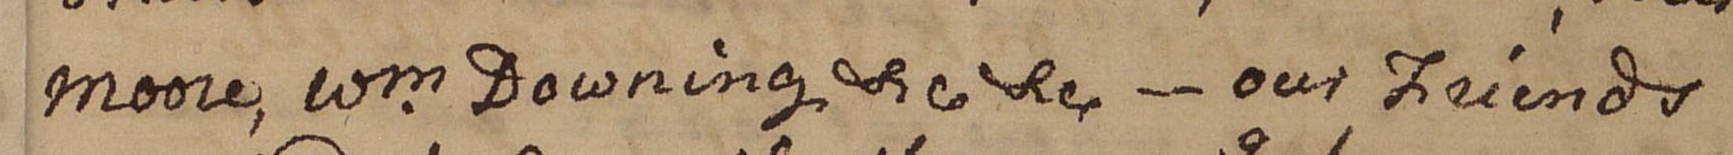Moore, W^m. Downing &c &c -- our Friends
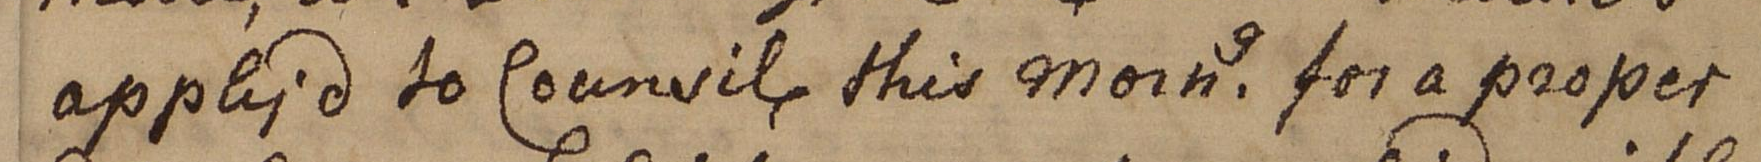apply'd to Counsil this morn^g. for a proper
